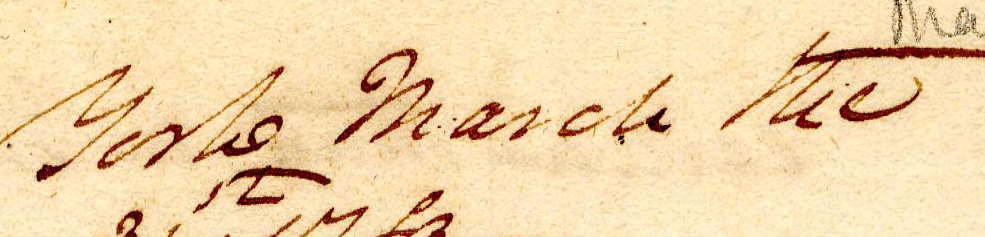York March the
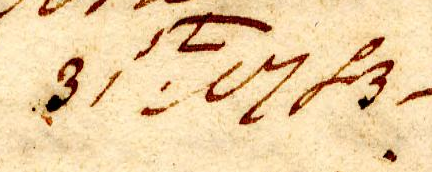31^st 1783
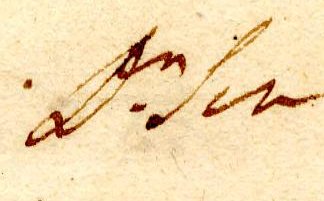D^r Sir
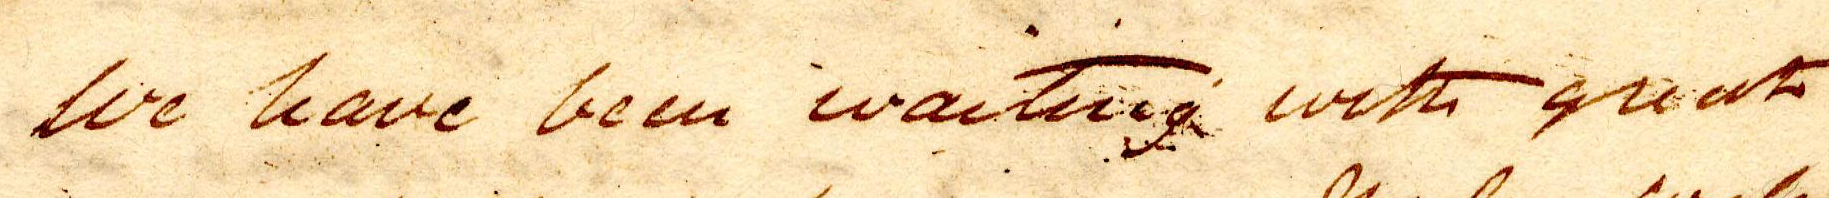we have been waiting with great
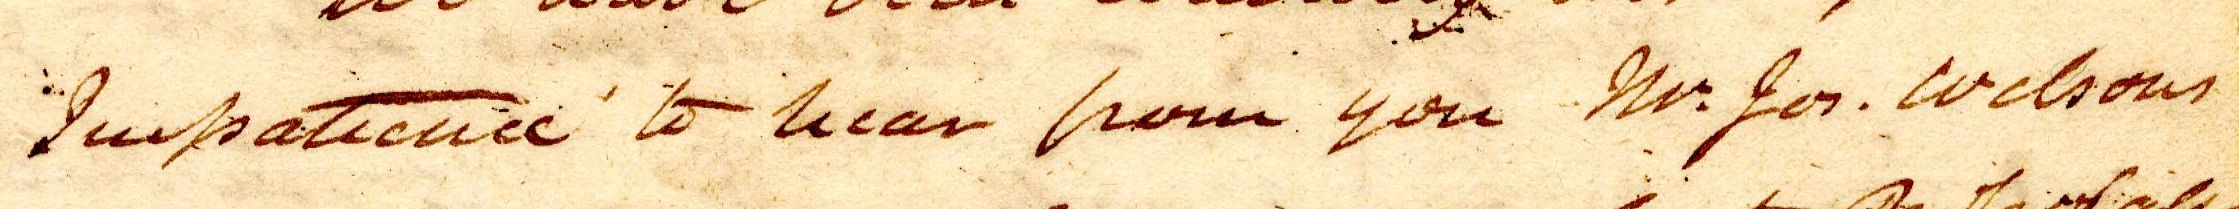Impatience to hear from you M^r. Jos. Wilsons
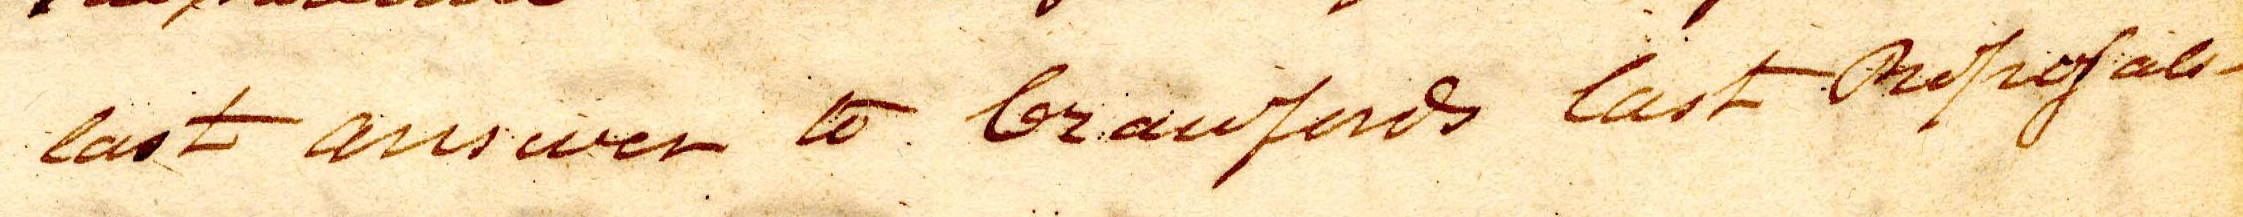last answer to Crawfords last Proposals
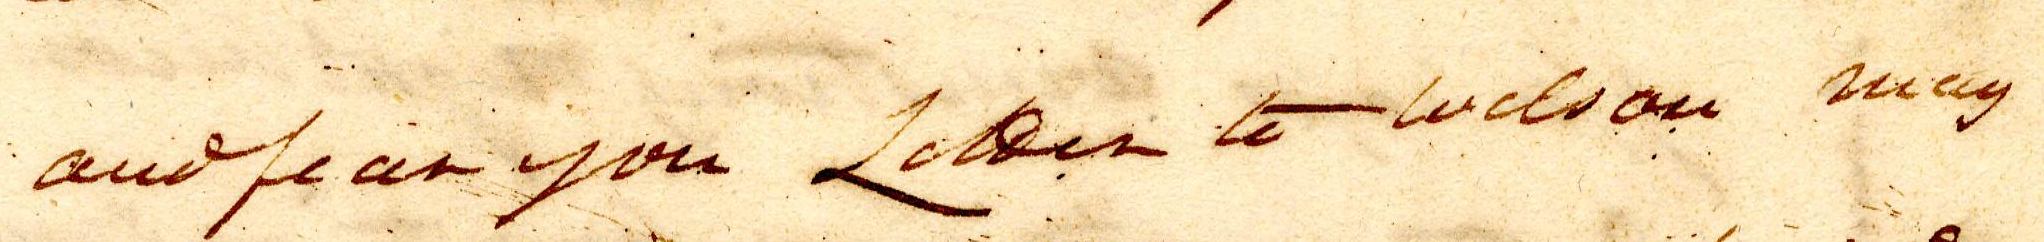and fear your Letter to Wilson may
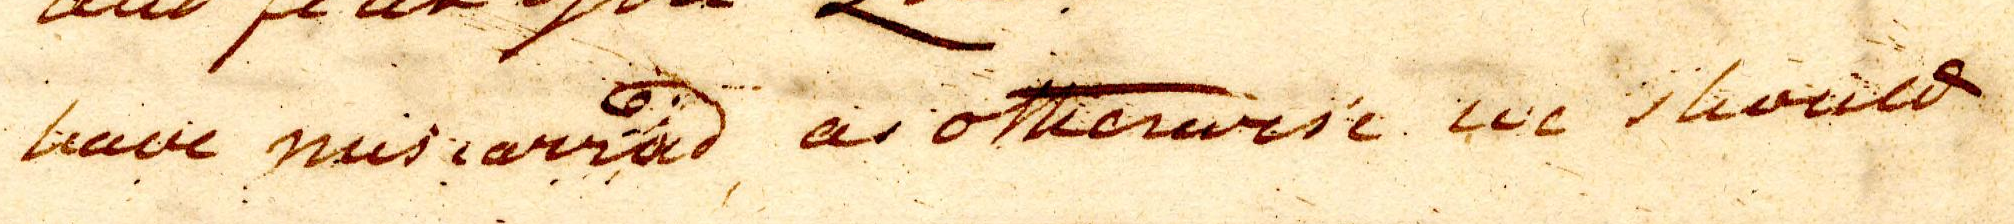have miscarried as otherwise we should
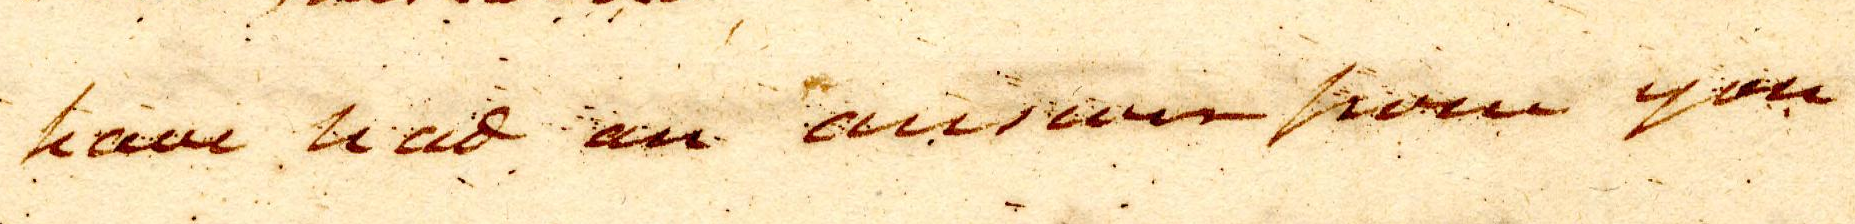have had an answer from you
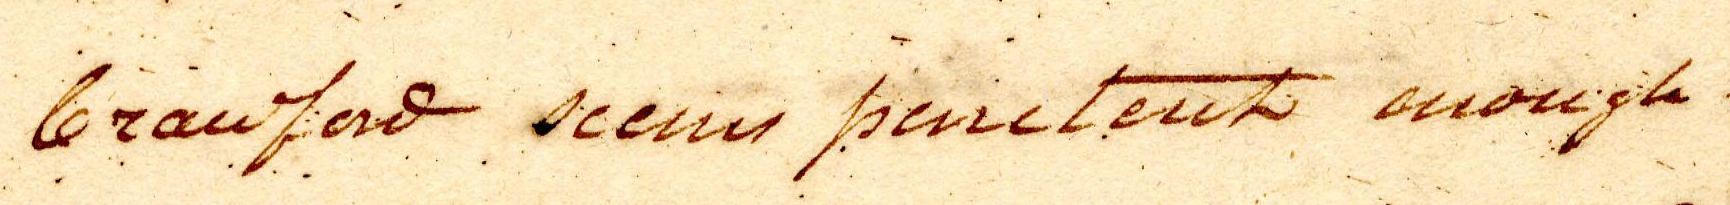Crawford seems paitent enough
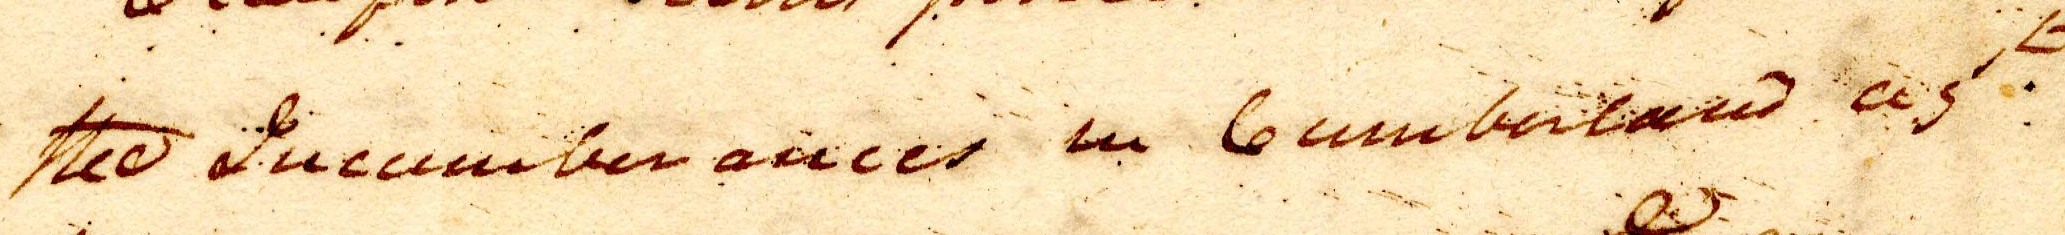the Incumberances in Cumberland ag^t
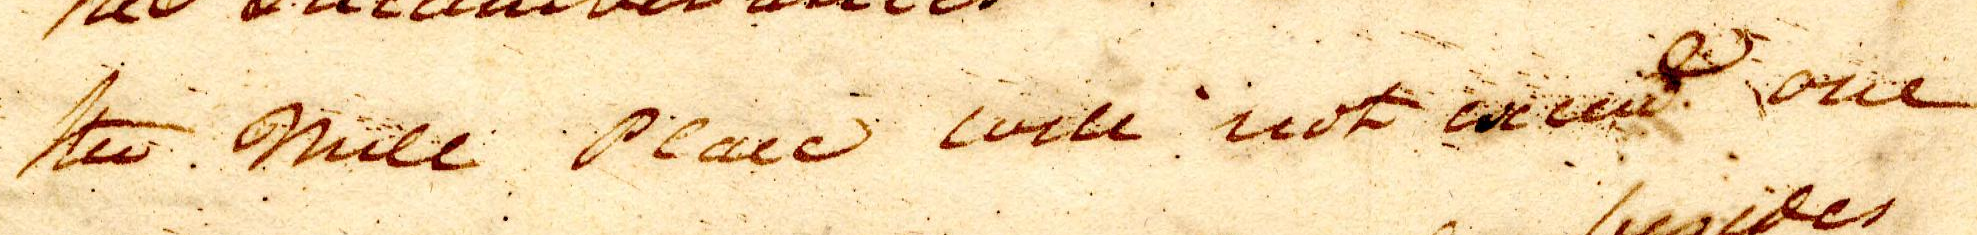the Mill Place will not exceed one
